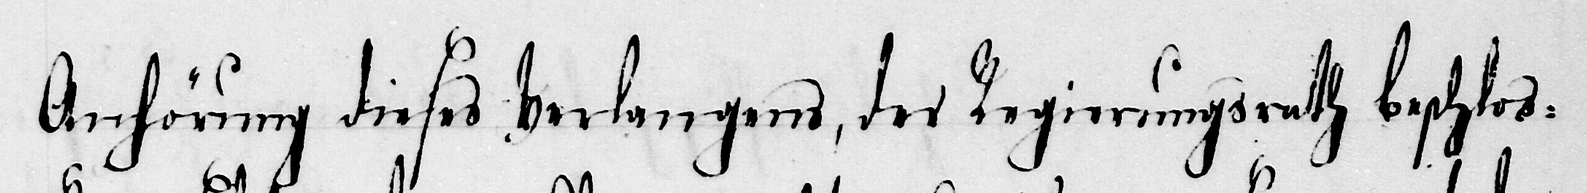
Anhörung diese Verlangens, der Regierungsrath beschlo¬
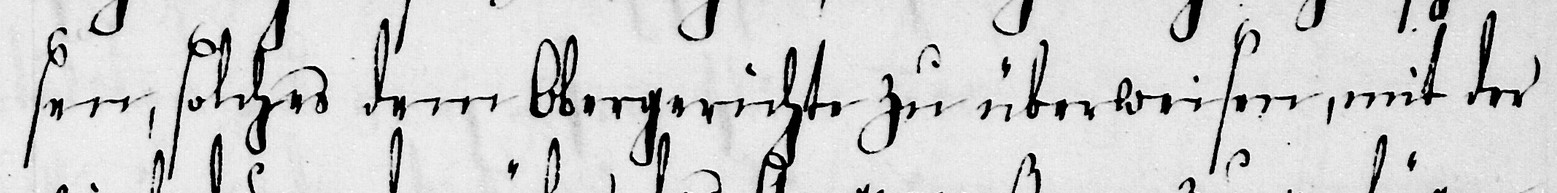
ßen, solches dem Obergerichte zu überweisen, mit der
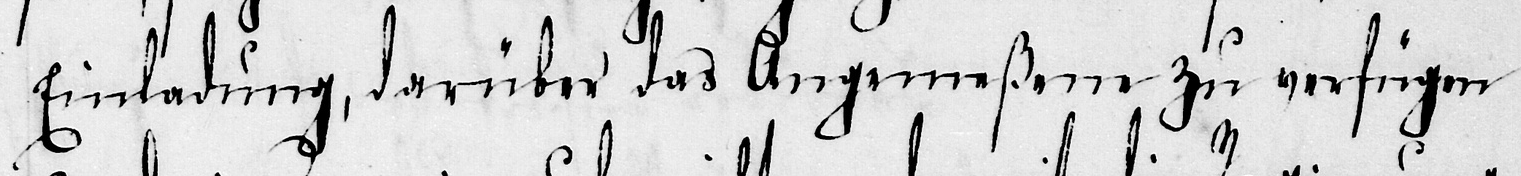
Einladung, darüber das Angemeßene zu verfügen
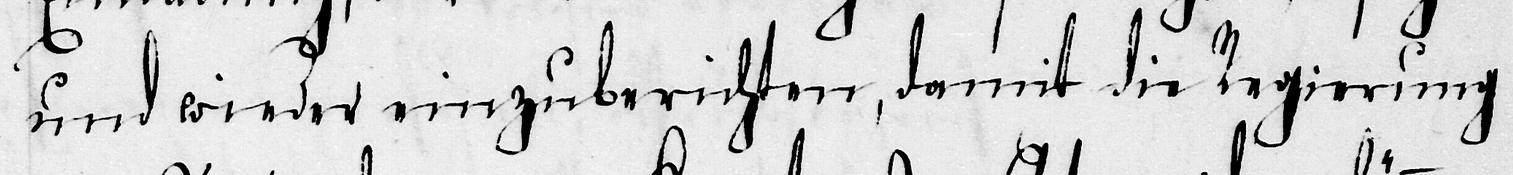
und wieder einzuberichten, damit die Regierung
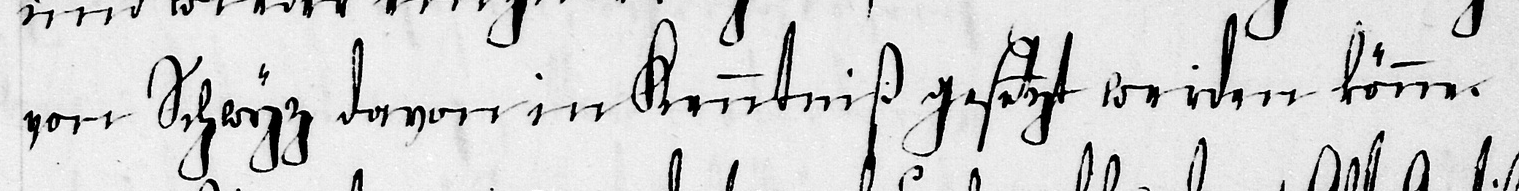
von Schwyz davon in Kenntniß gesetzt werden könne.
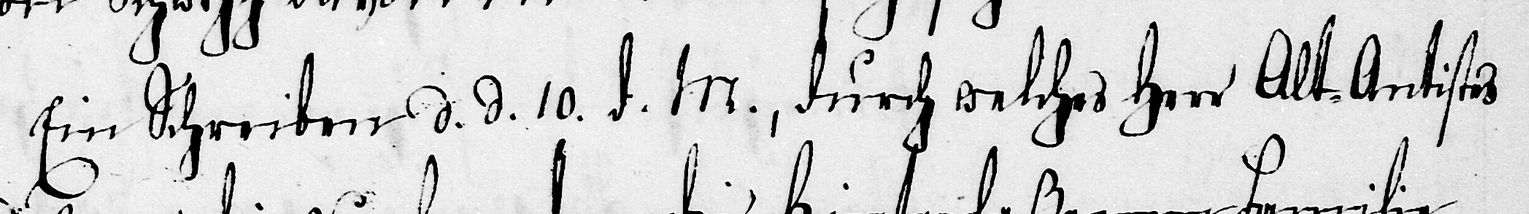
Ein Schreiben d. d. 10. d. M., durch welches Herr Alt-Antistes
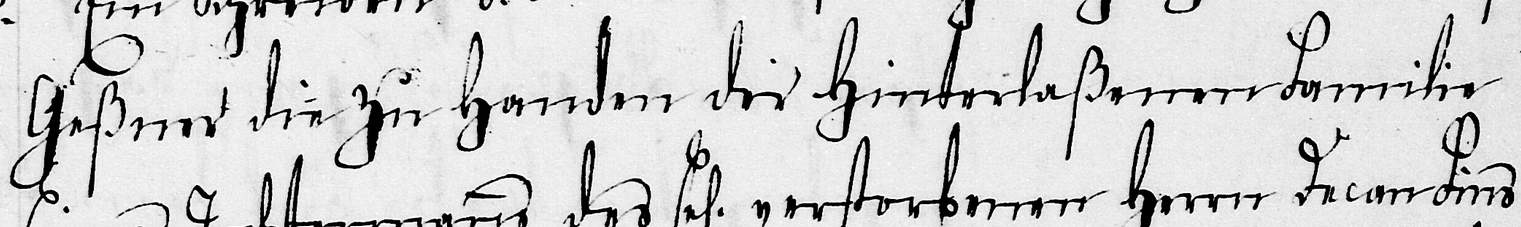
Geßner die zu Handen der Hinterlaßenen Familie
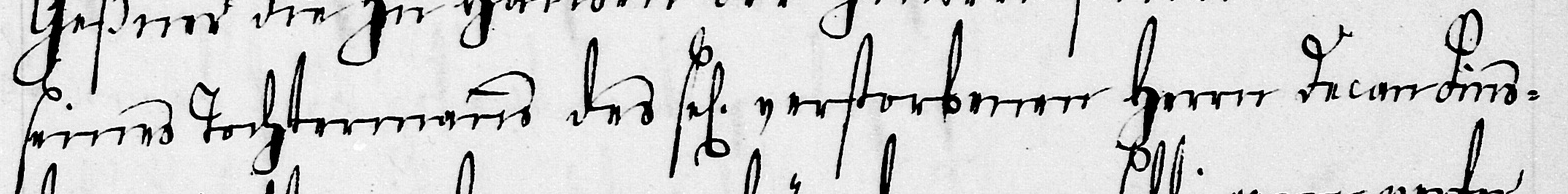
seines Tochtermanns des sel[igen] verstorbenen Herrn Decan Fins¬
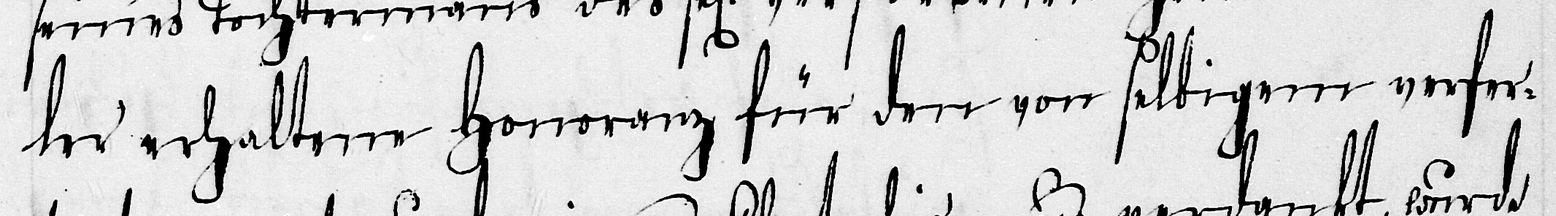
ler erhaltene Honoranz für den von selbigem verfer¬
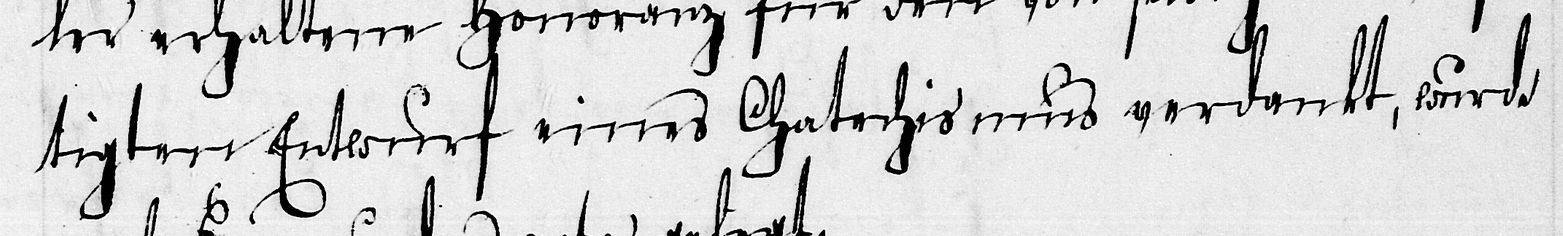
tigten Entwurf eines Chatechismus verdankt, wurde
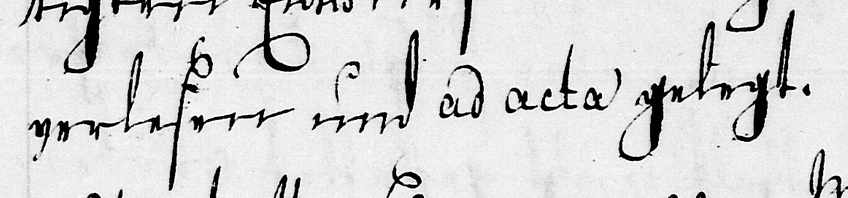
verlesen und ad acta gelegt.
